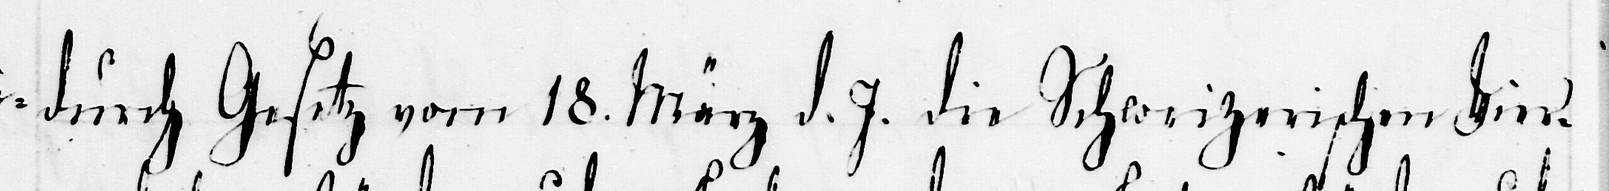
durch Gesetz vom 18. März d. J. die Schweizerischen Vier¬
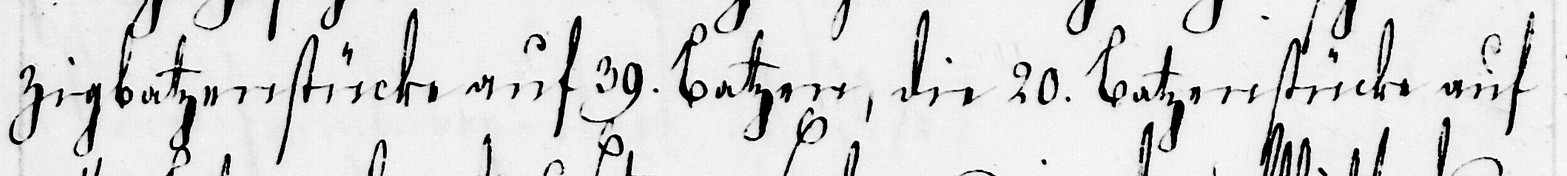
zigbatzenstücke auf 39. Batzen, die 20. Batzenstücke auf
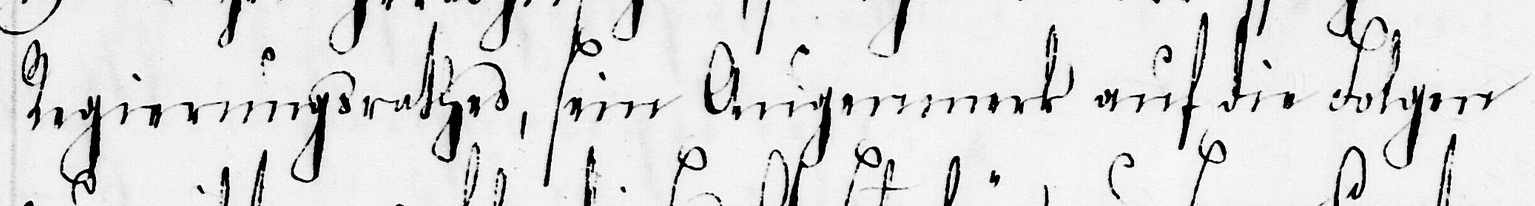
Regierungsrathes, sein Augenmerk auf die Folgen
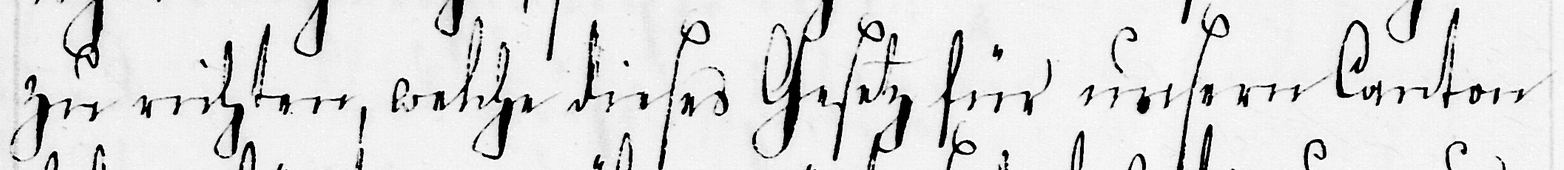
zu richten, welche dieses Gesetz für unsern Canton
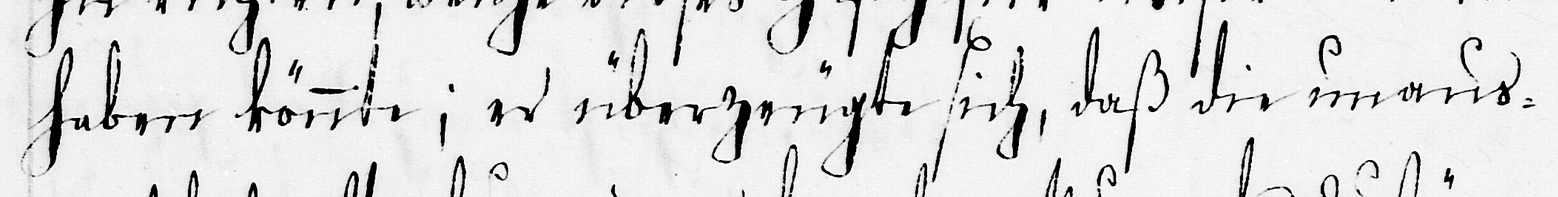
haben könnte; er überzeugte sich, daß die unaus¬
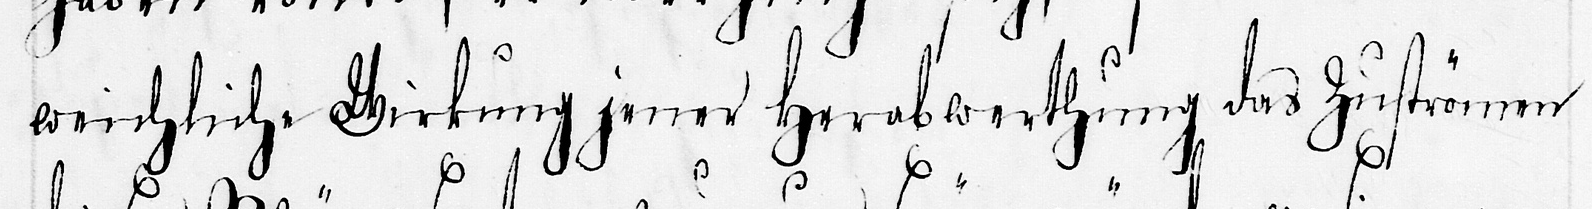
weichliche Wirkung jener Herabwerthung das Zuströmen
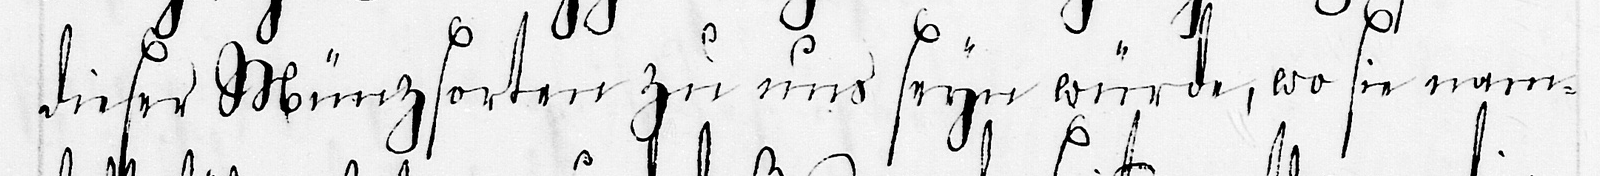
dieser Münzsorten zu uns seyn würde, wo sie nam¬
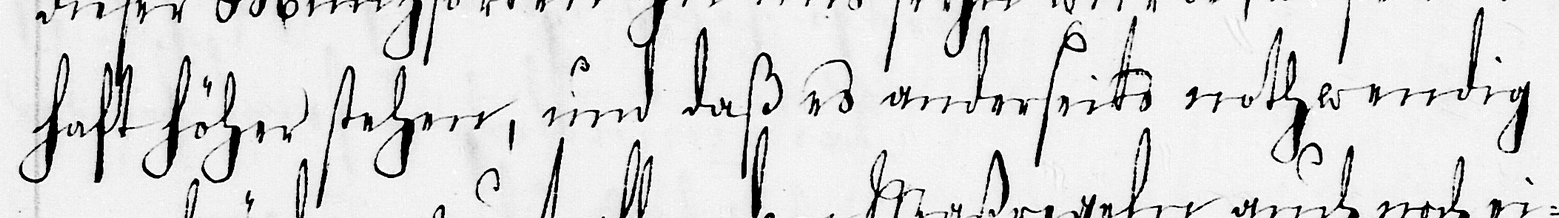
haft höher stehen, und daß es anderseits nothwendig
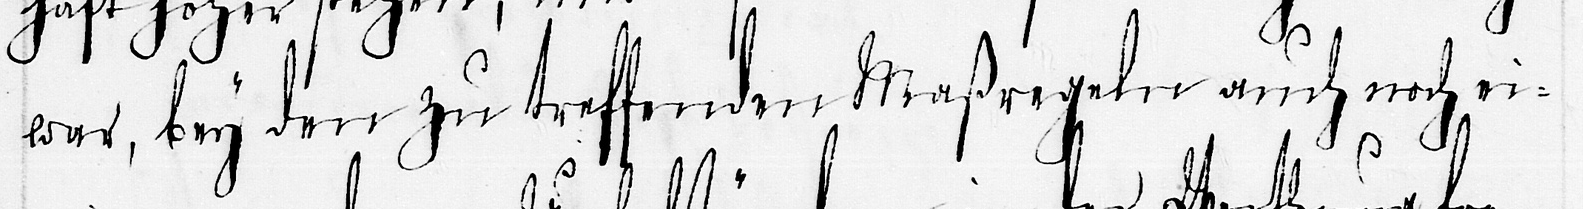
war, bey den zu treffenden Maßregeln auch noch ei¬
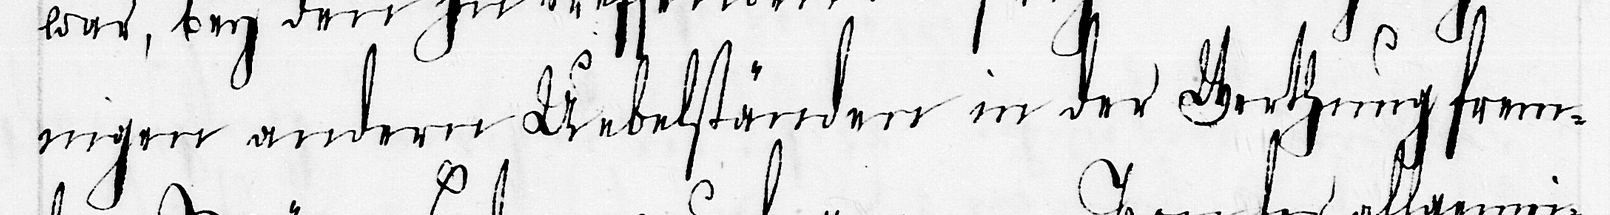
nigen andern Uebelständen in der Werthung frem¬
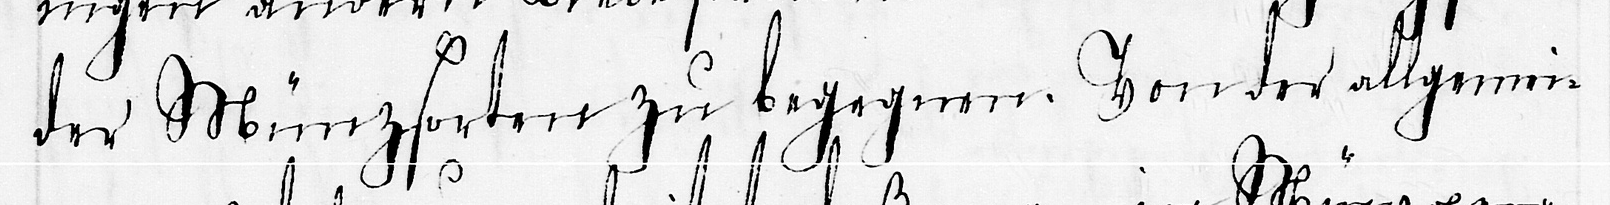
der Münzsorten zu begegnen. Von der allgemei¬
